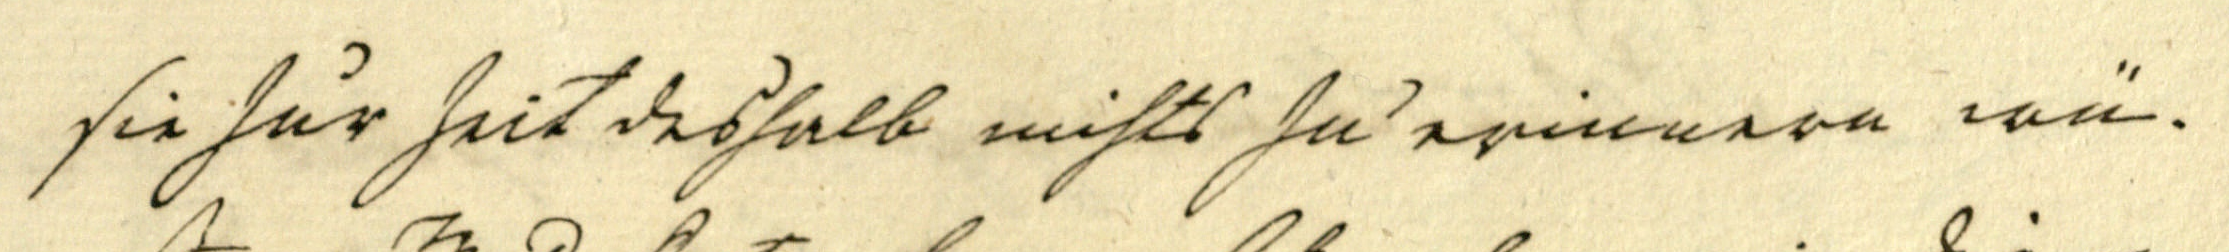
sie zur Zeit deshalb nichts zu erinnern wü¬
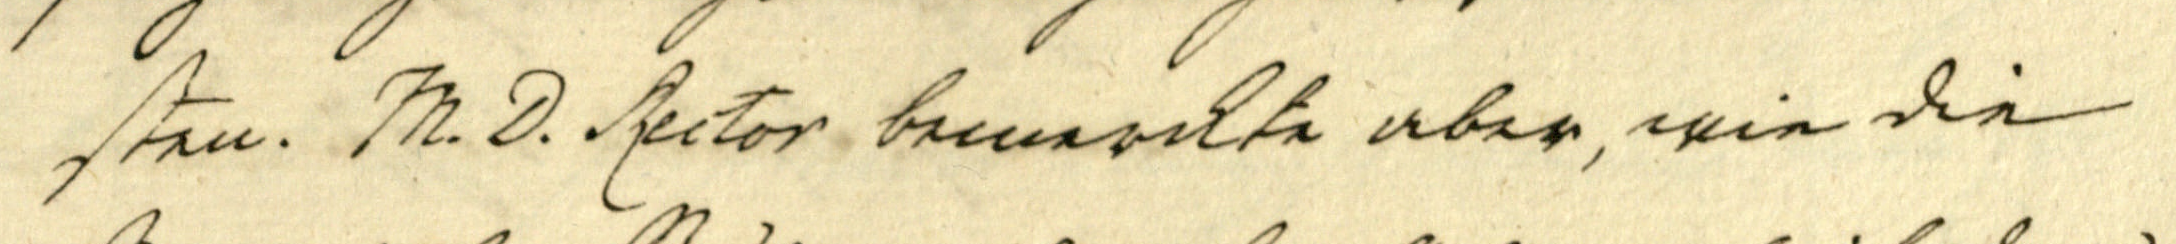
sten. M. D. Rector bemerckte aber, wie die
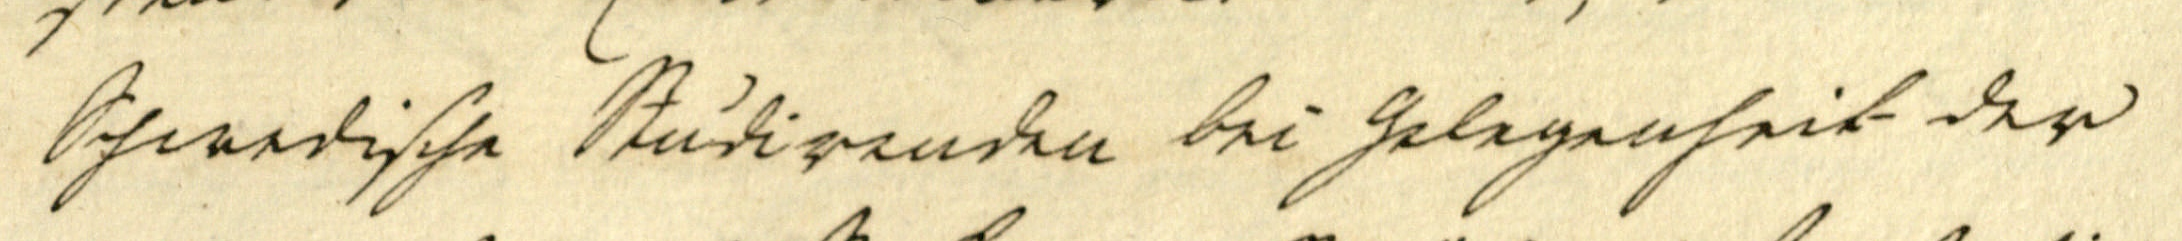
Schwedische Studirenden bei Gelegenheit der
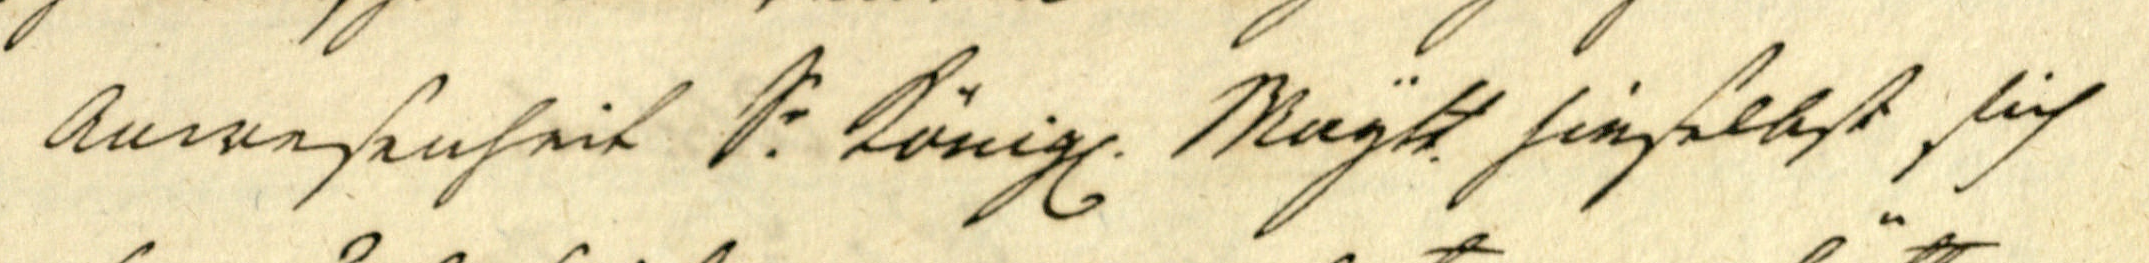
Anwesenheit Sr. Königl. Maÿtt. hieselbst sich
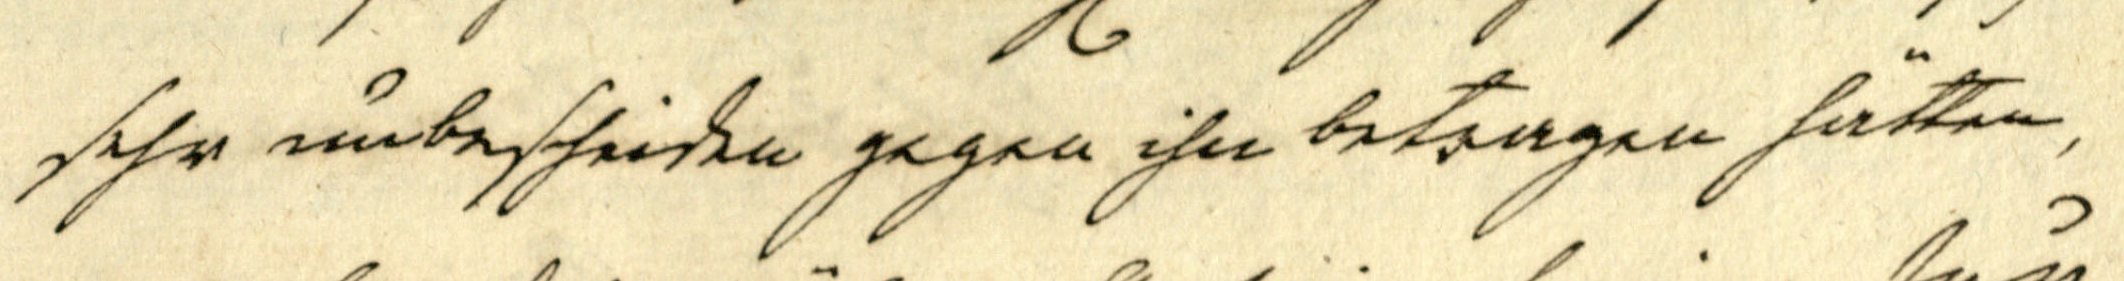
sehr unbescheiden gegen ihn betragen hätten,
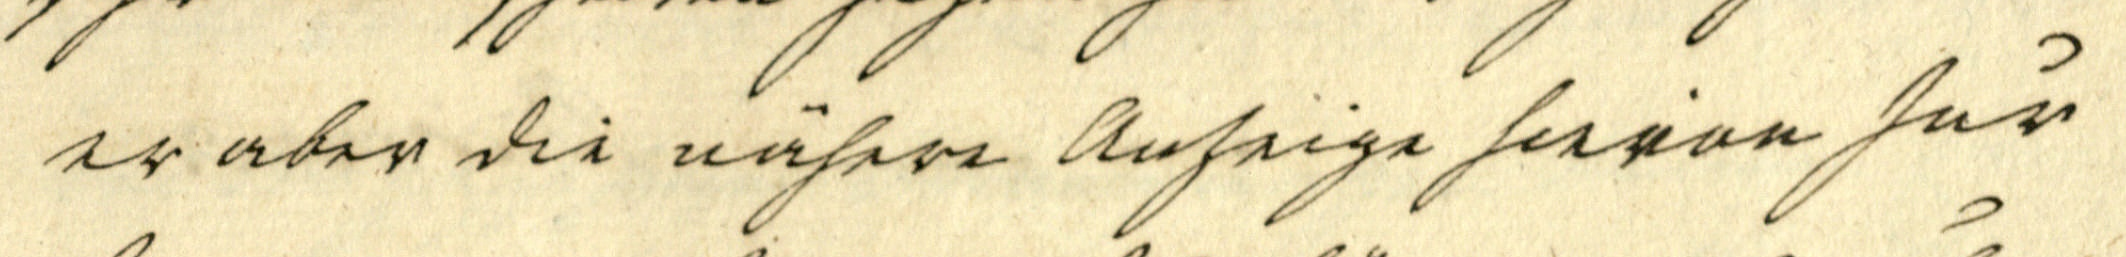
er aber die nähere Anzeige hievon zur
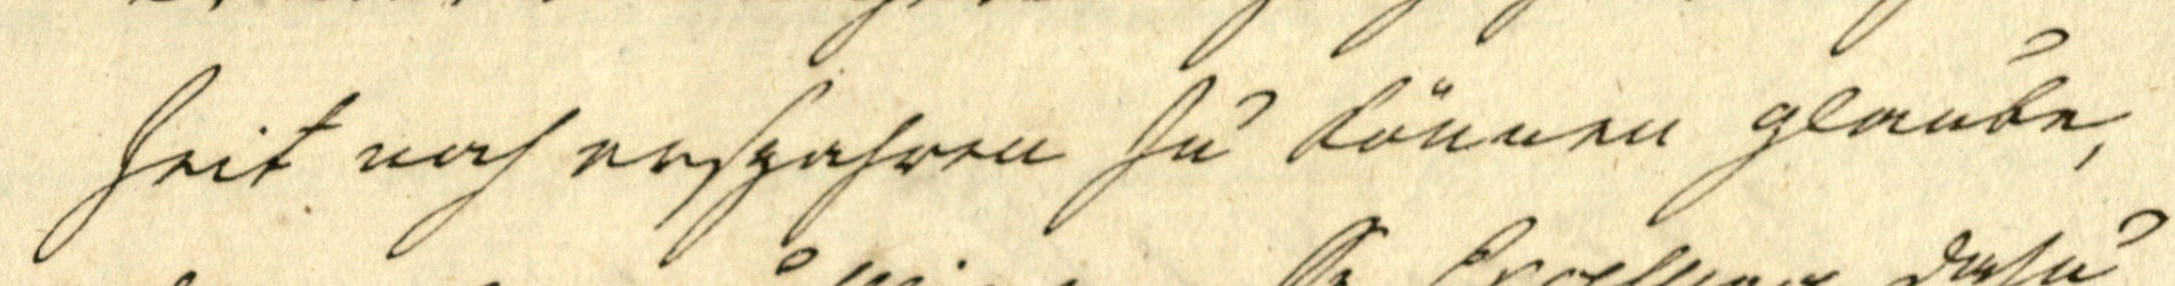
Zeit noch erspahren zu können glaube,
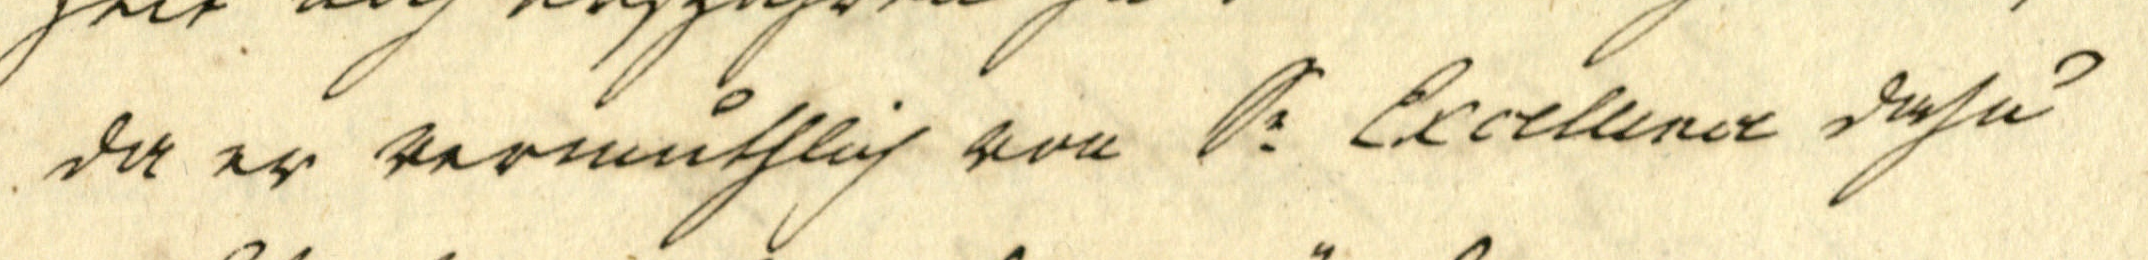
da er vermuthlich von Sr. Excellence dazu
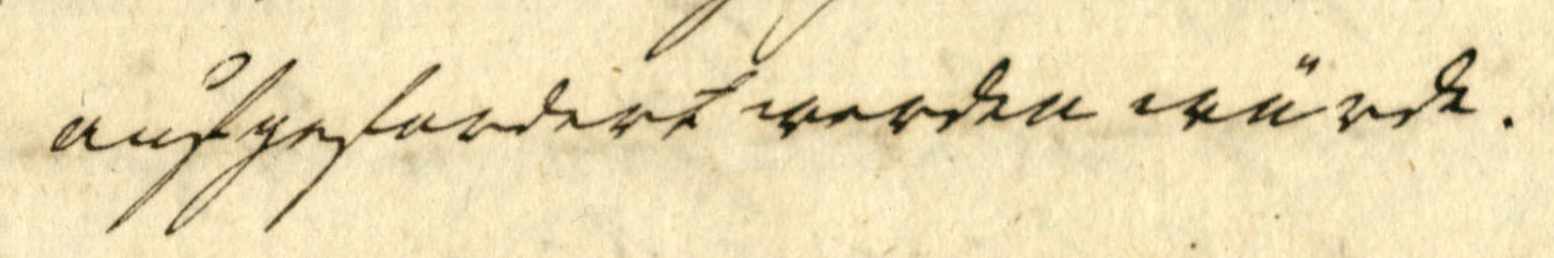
aufgefordert werden würde.
